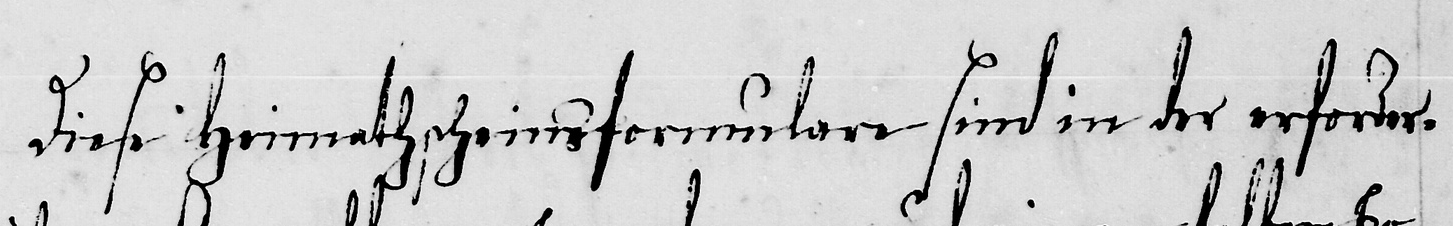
Diese Heimathscheinsformulare sind in der erforder¬
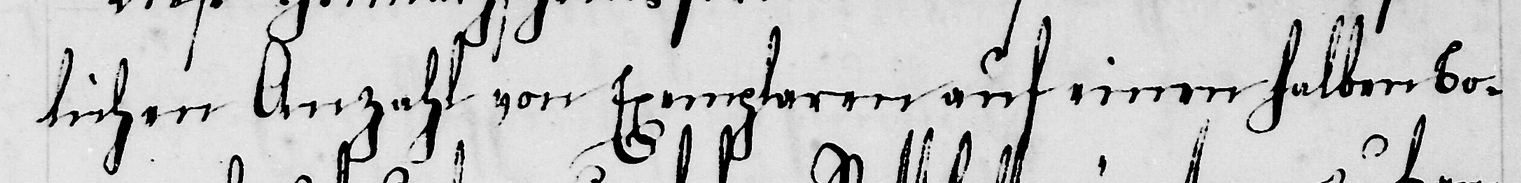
lichen Anzahl von Exemplaren auf einen halben Bo¬
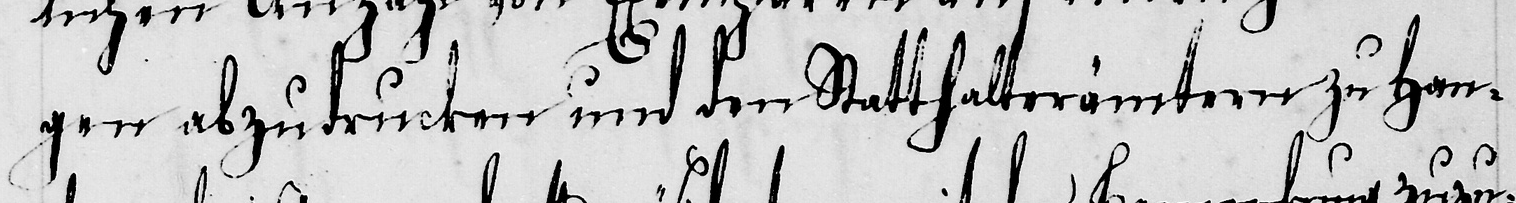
gen abzudrucken und den Statthalterämtern zu Han¬
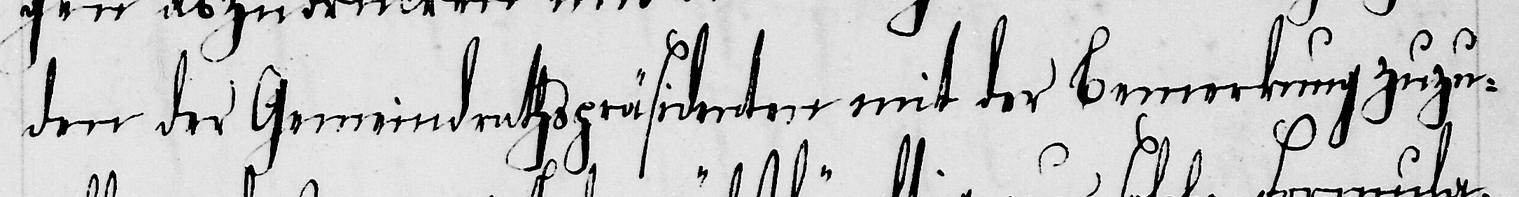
den der Gemeindrathspräsidenten mit der Bemerkung zuzu¬
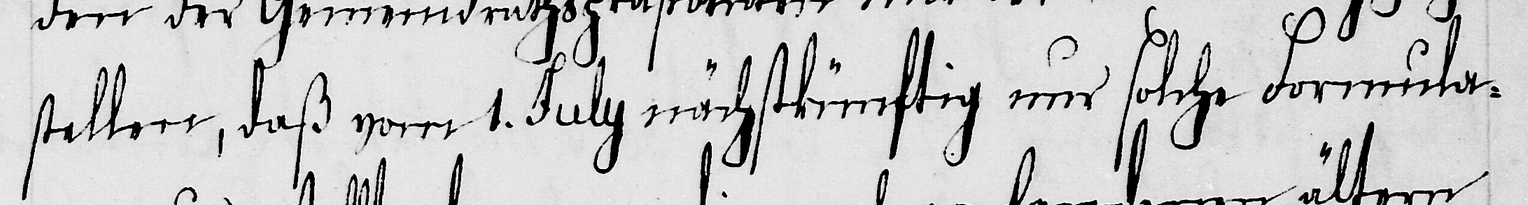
stellen, daß vom 1. July nächstkünftig nur solche Formula¬
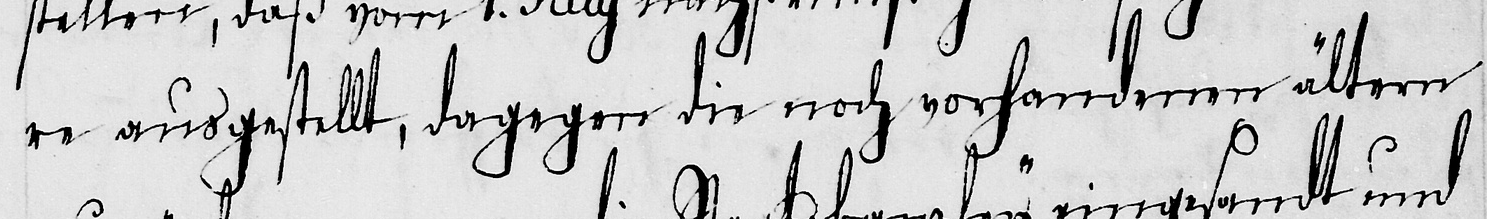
re ausgestellt, dagegen die noch vorhandenen ältern
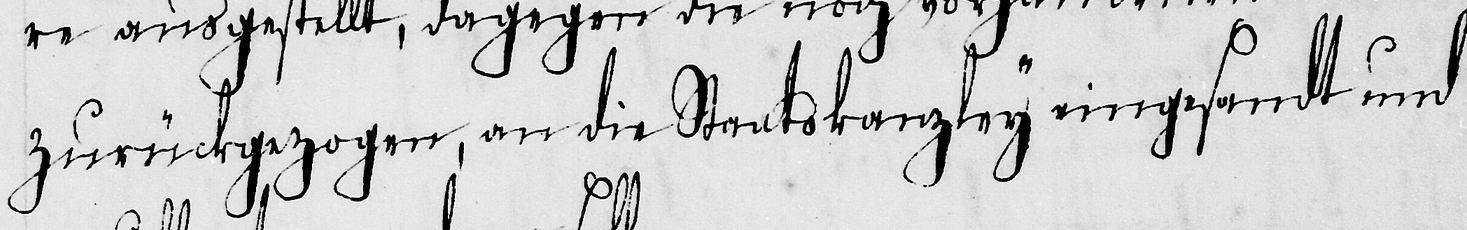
zurückgezogen, an die Staatskanzley eingesandt und
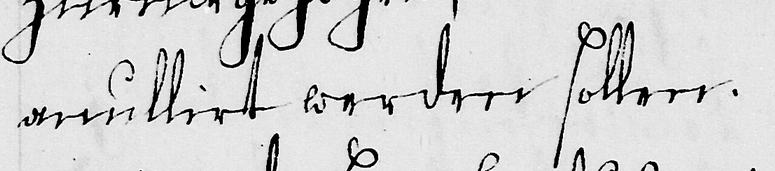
anullirt werden sollen.
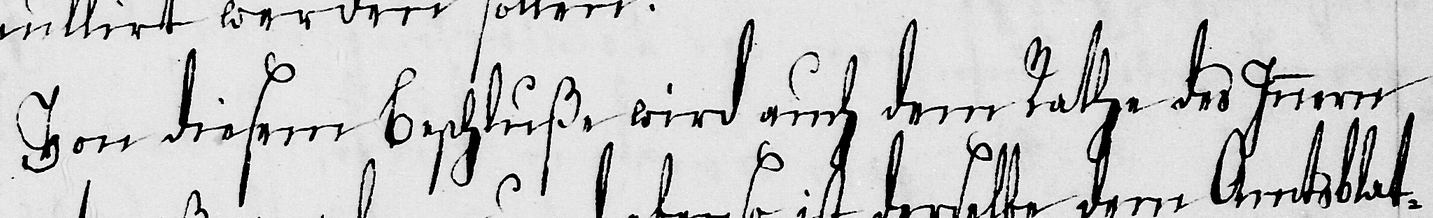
Von diesem Beschluße wird auch dem Rathe des Innern
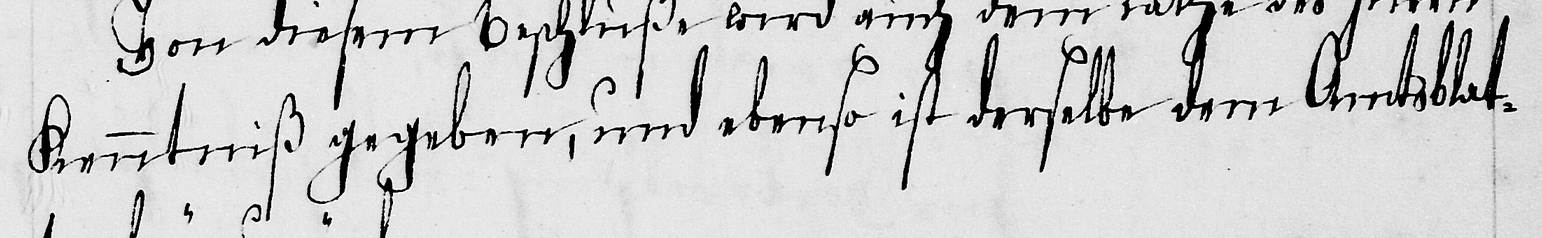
Kenntniß gegeben, und ebenso ist derselbe dem Amtsblat¬
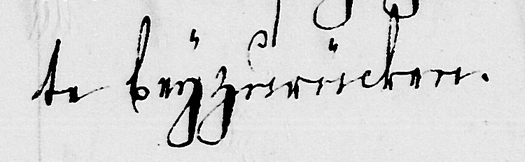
t beyzurücken.
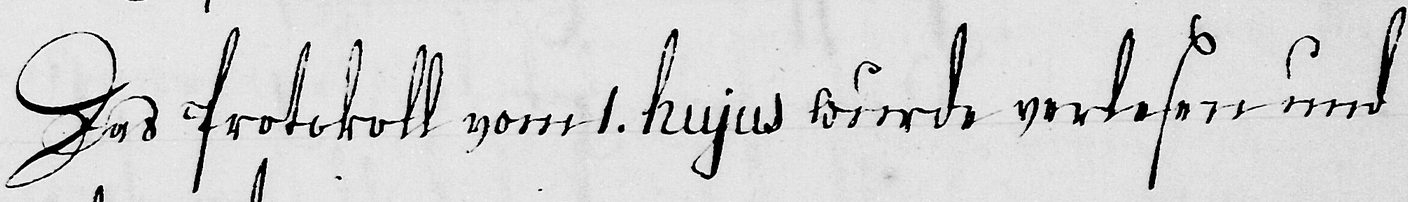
Das Protokoll vom 1. hujus wurde verlesen und
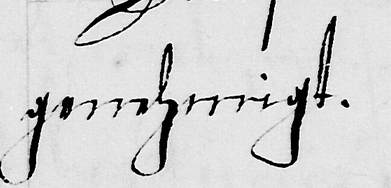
genehmigt.
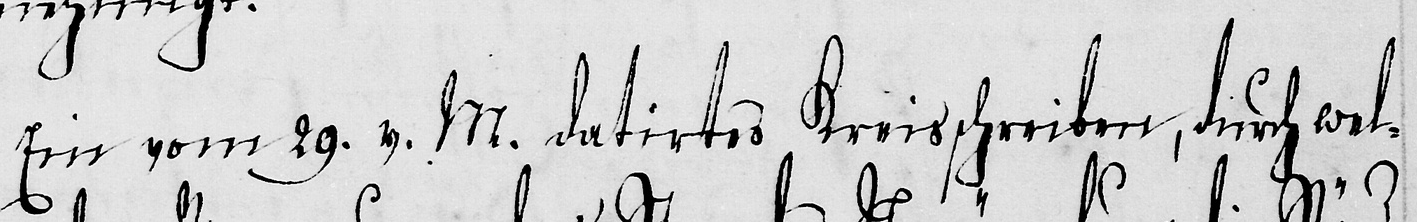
Ein vom 29. v. M. datirtes Kreisschreiben, durch welc¬
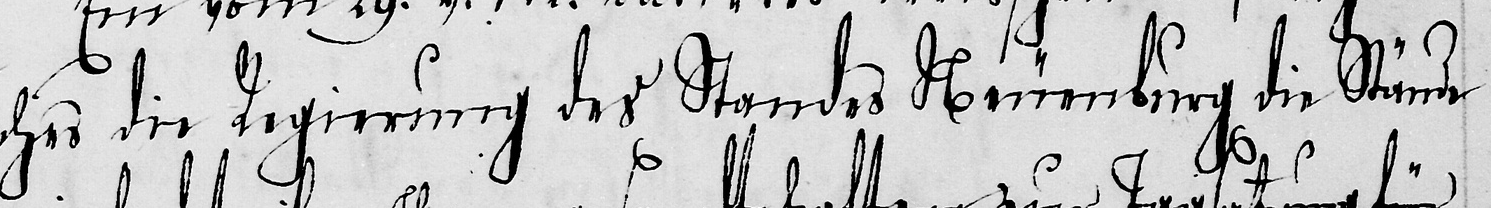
hes die Regierung des Standes Neuenburg die Stände
